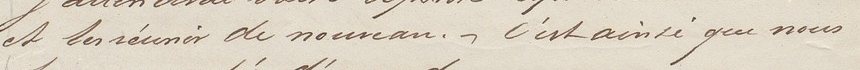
et les réunir de nouveau. – C'est ainsi que nous
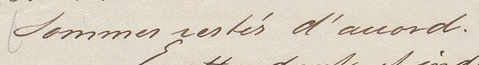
sommes restés d'accord.
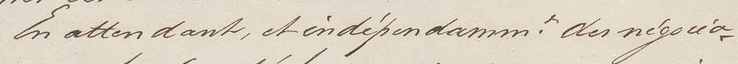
En attendant, et indépendammt des négocia-
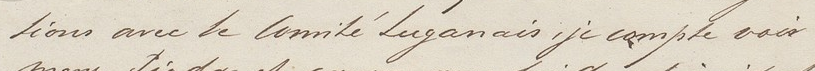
tions avec le Comité Luganais, je compte voir
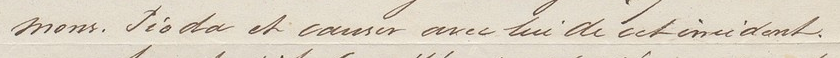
Mons. Pioda et causer avec lui de cet incident.
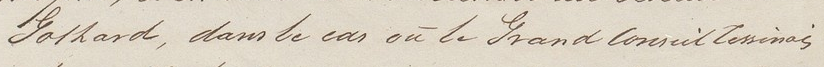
Gothard, dans le cas où le Grand Conseil Tessinois
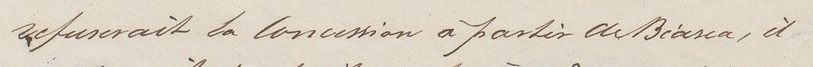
refuserait la Concession à partir de Biasca, il
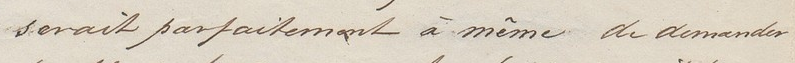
serait parfaitement à même de demander
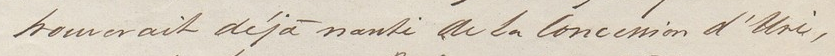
trouverait déjà nanti de la Concession d'Uri,
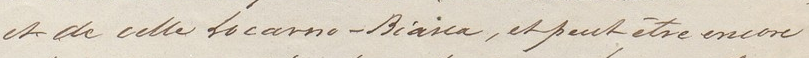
et de celle Locarno–Biasca, et peut-être encore
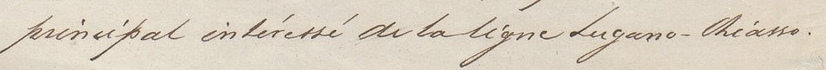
principal intéressé de la ligne Lugano–Chiasso.
